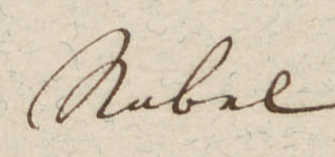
Nebel
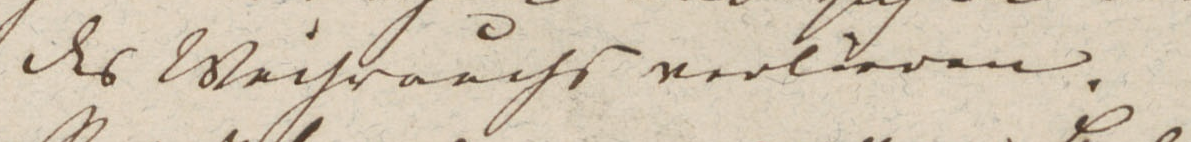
des Weihrauchs verlieren.
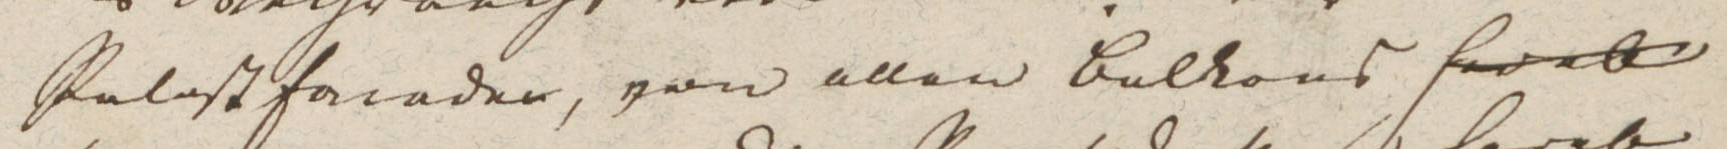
Palastfacaden, von allen Balkons herab
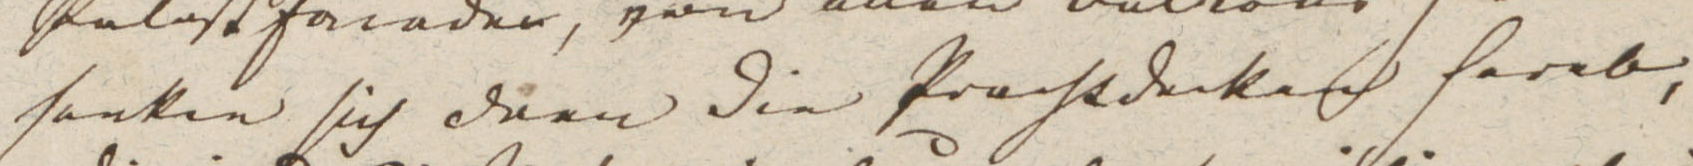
senken sich dann die Prachtdecken herab,
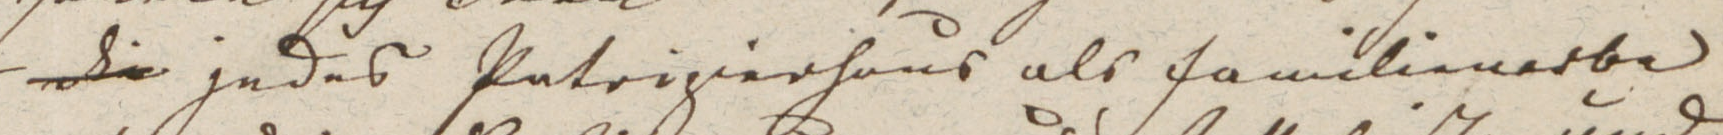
die jedes Patrizierhaus als Familienerbe
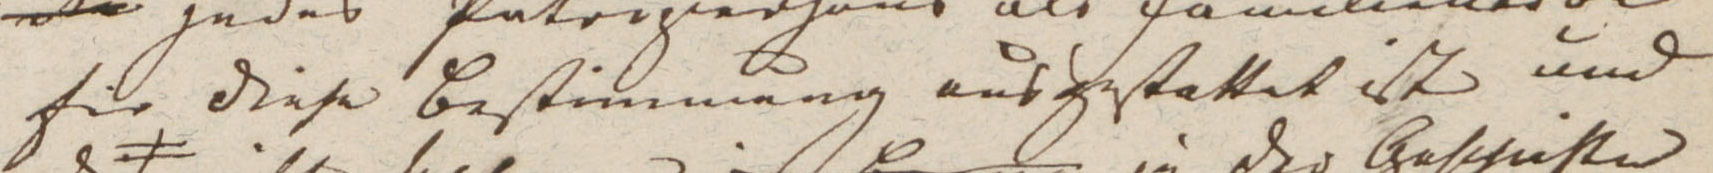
für diese Bestimmung ausgestattet ist und
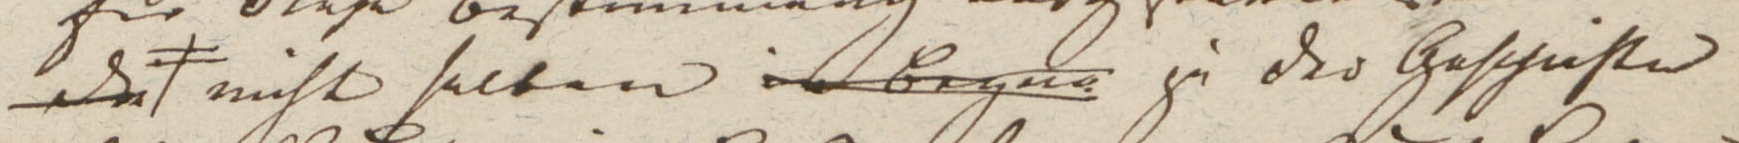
die % nicht selten in Bezu zu der Geschichte
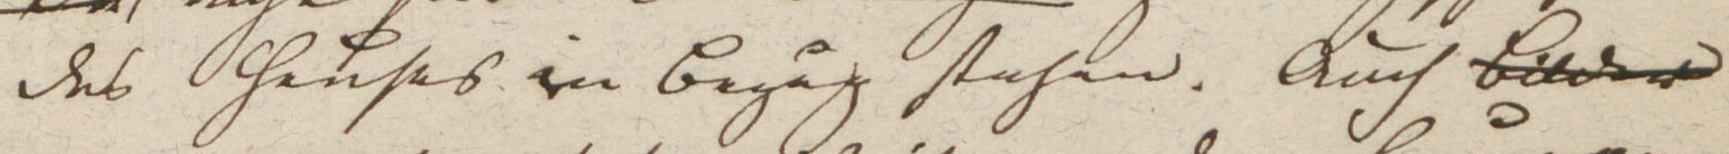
des Hauses in Bezug stehen. Auch Bilder
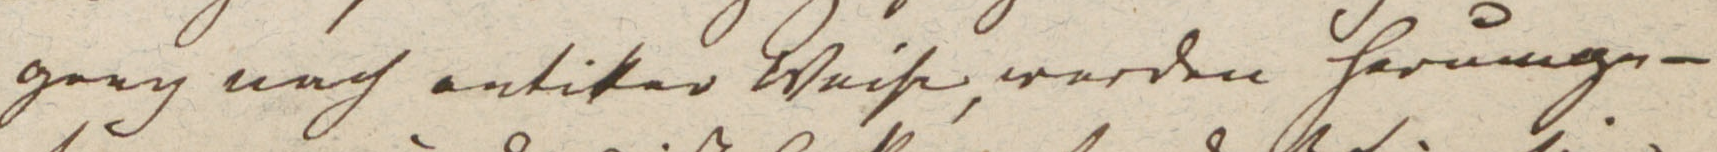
ganz nach antiker Weise, werden herumge-
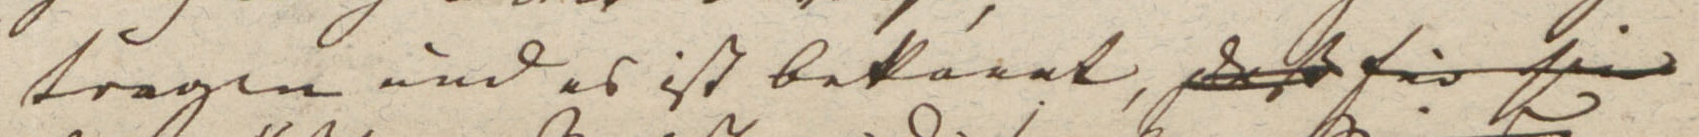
tragen und es ist bekannt, dass für sie
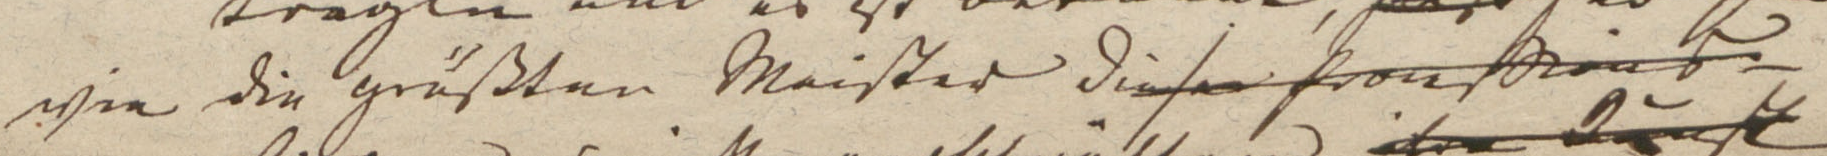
wie die grössten Meister diese Processions-
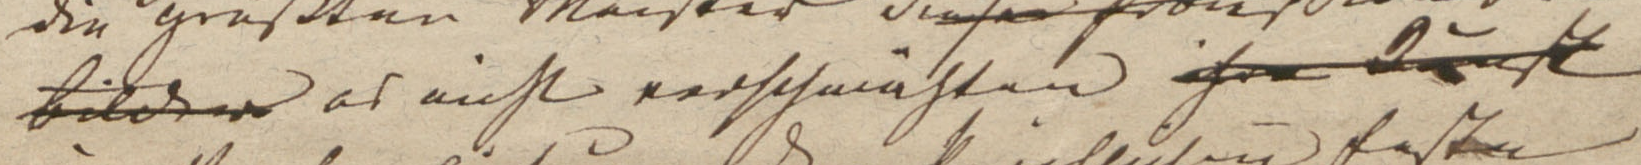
bilder es nicht verschmähten ihre Kunst
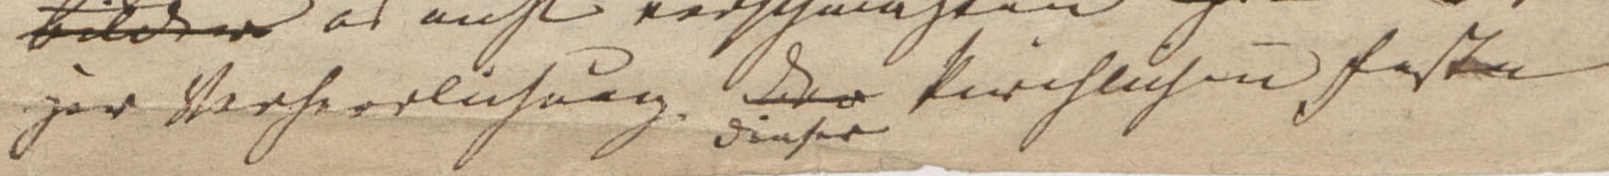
zur Verherrlichung der dieser kirchlichen Feste
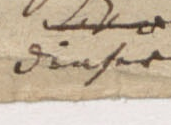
% deren
